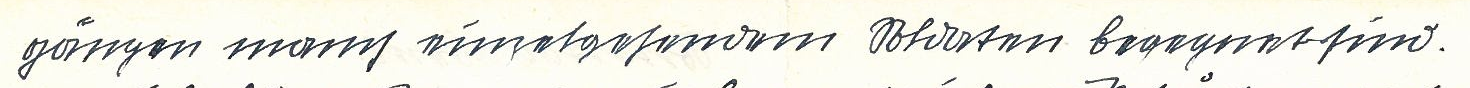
gängen manch einzelgehendem Soldaten begegnet sind.
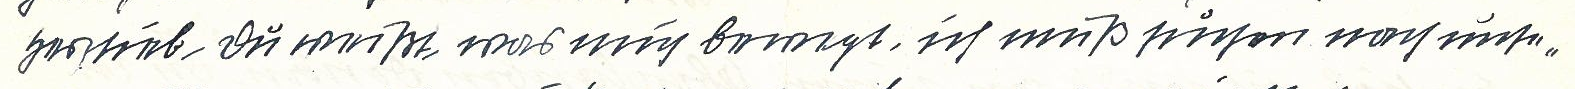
Herzlieb, Du weißt, was mich bewegt, ich muss suchen nach unse¬
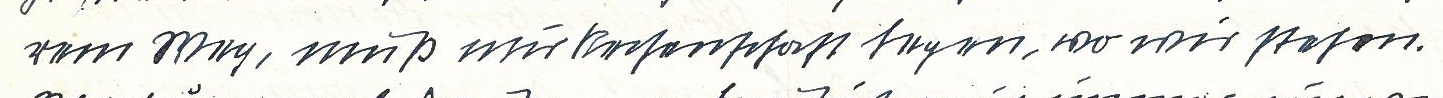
rem Weg, muß mir Rechenschaft legen, wo wir stehen.
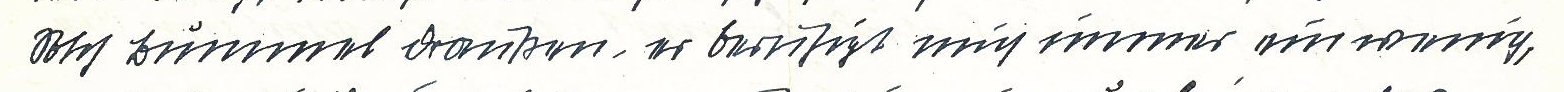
Solch Bummel draußen, er beruhigt mich immer ein wenig,
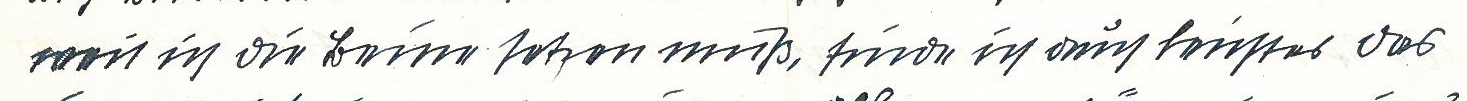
weil ich die Beine setzen muß, finde ich auch leichter das
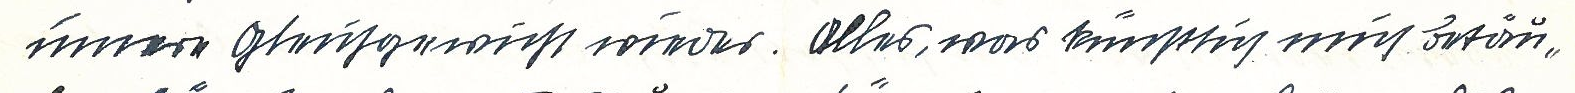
innere Gleichgewicht wieder. Alles, was künstlich mich betäu¬
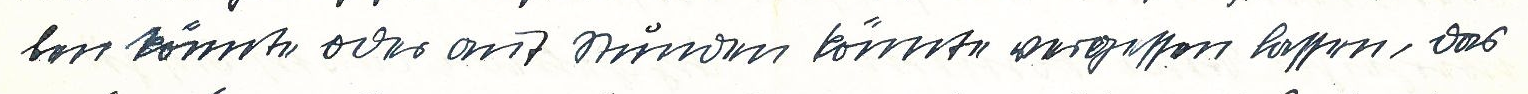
ben könnte oder auf Stunden könnte vergessen lassen, das
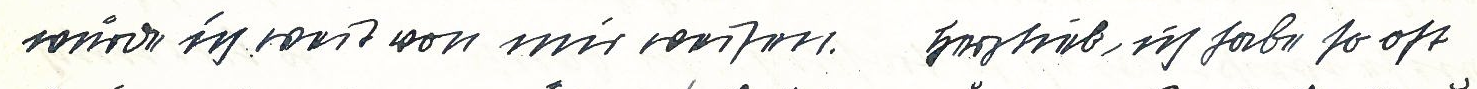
würde ich weit von mir weisen. Herzlieb, ich habe so oft
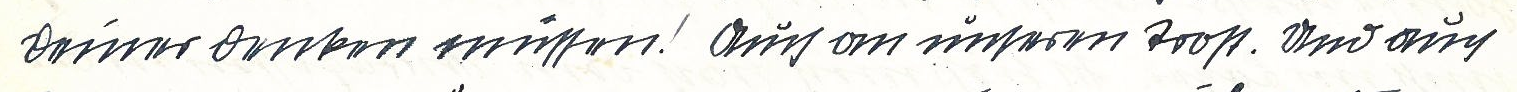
Deiner denken müssen! Auch an unseren Trost. Und auch
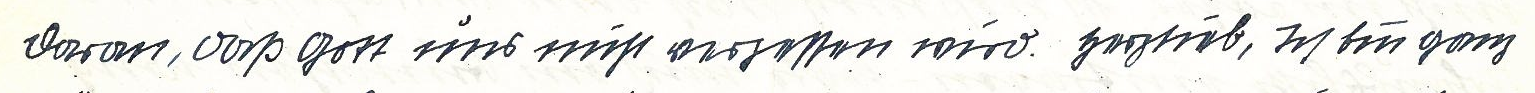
daran, daß Gott uns nicht vergessen wird. Herzlieb, ich bin ganz
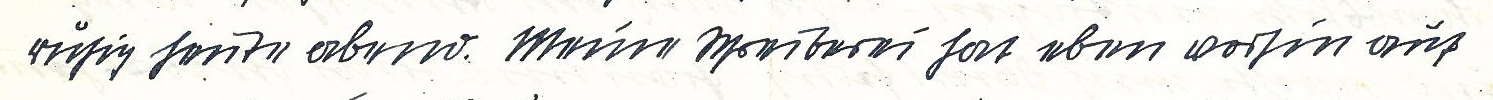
ruhig heute abend. Meine Schreiberei hat eben vorhin auf
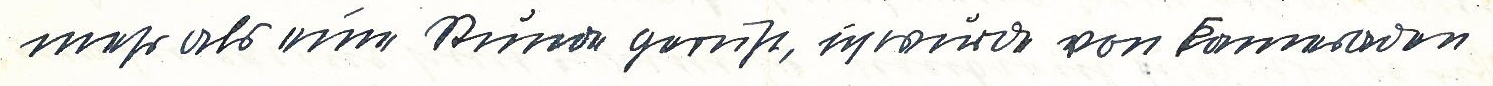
mehr als eine Stunde geruht, ich wurde von Kameraden
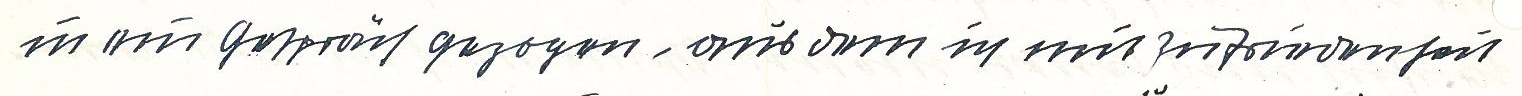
in ein Gespräch gezogen, aus dem ich mit Zufriedenheit
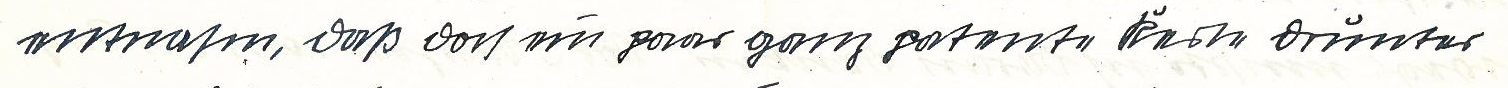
entnahm, daß doch ein paar ganz patente Kerle darunter
